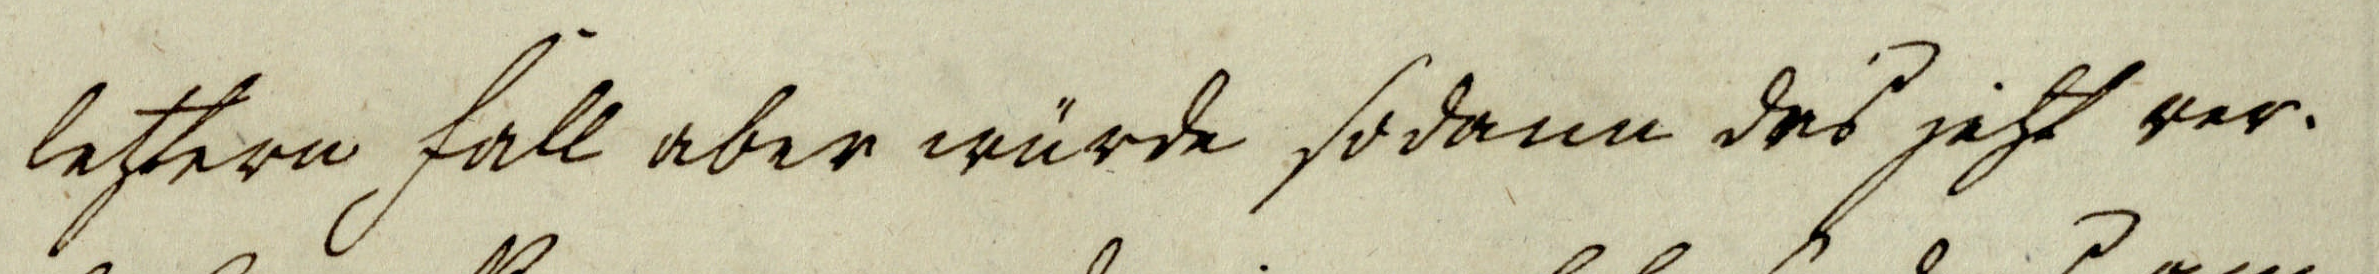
letztern Fall aber würde so dann das jetzt ver¬
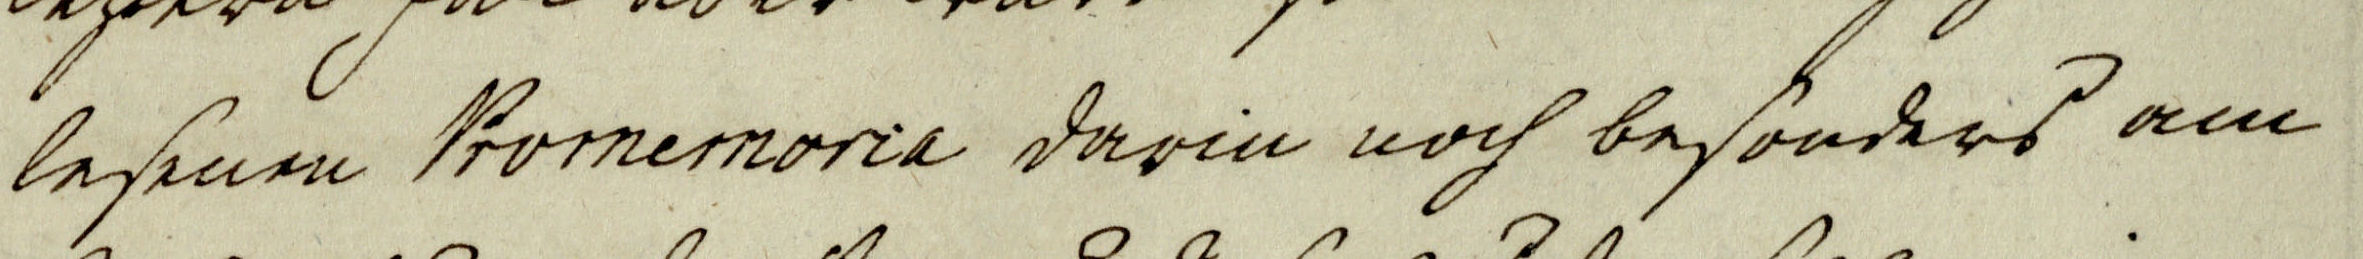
lesenen Promemoria darin noch besonders am
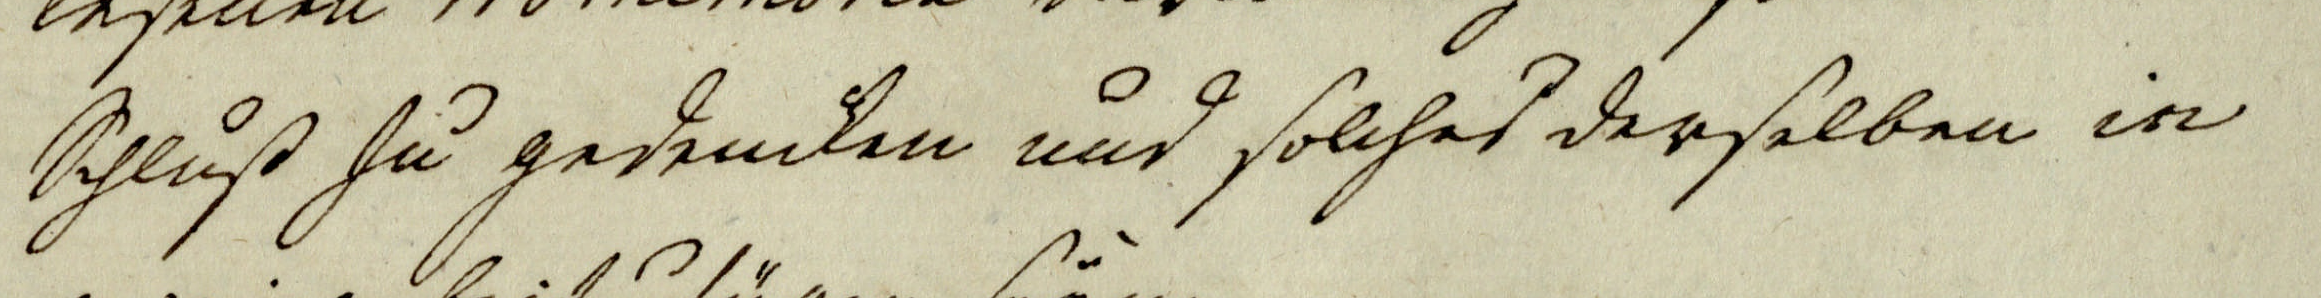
Schluß zu gedencken und solches derselben in
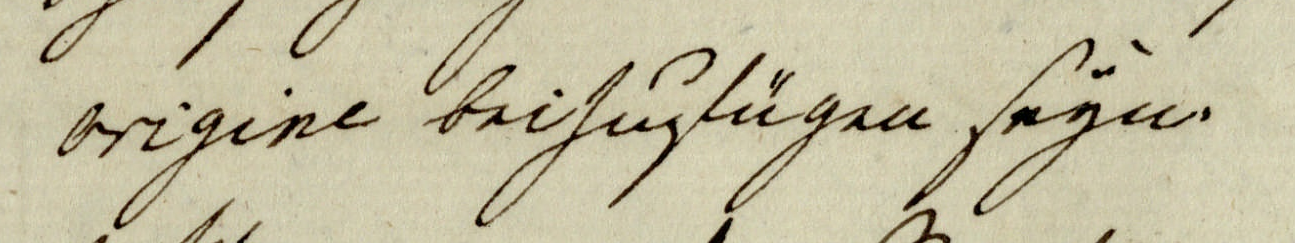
origine beizufügen seÿn.
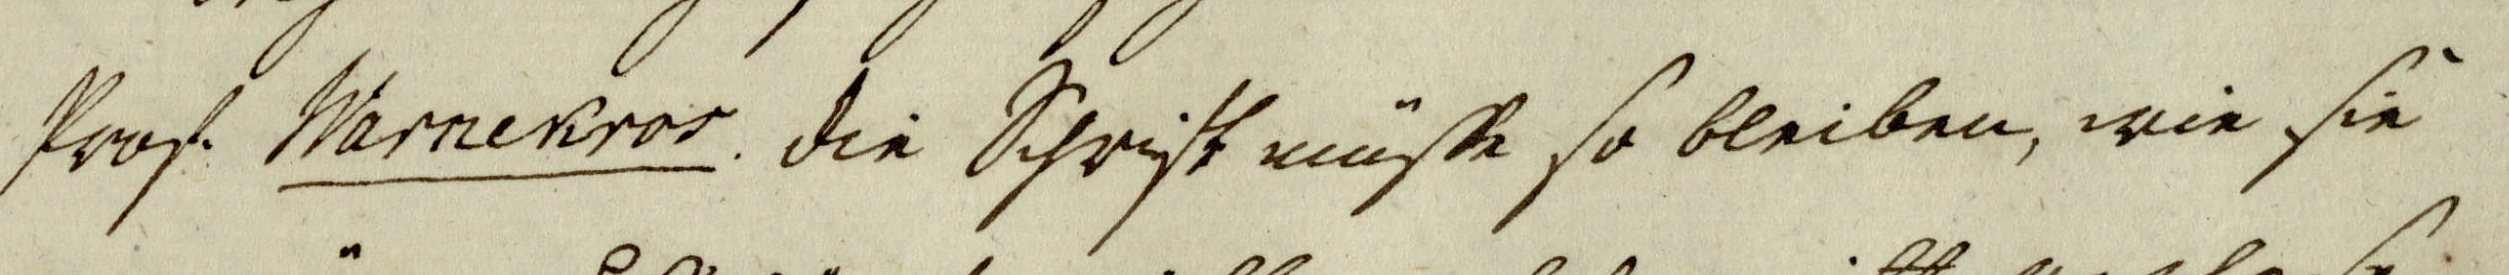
Prof. Warnekros. Die Schrift müsse so bleiben, wie sie
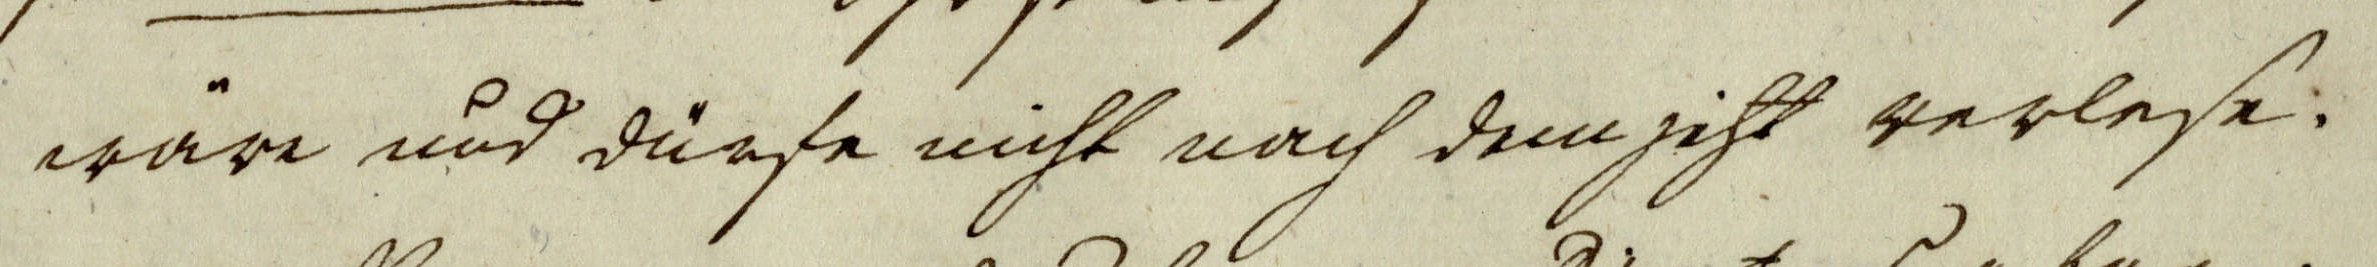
wäre und dürfe nicht nach dem jetzt verlese¬
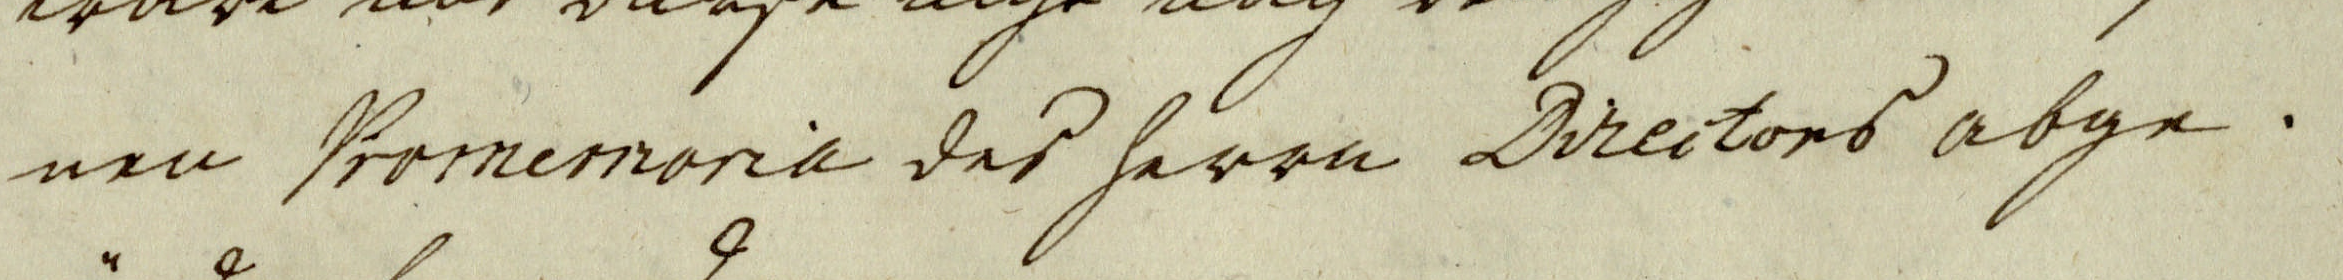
nen Promemoria des Herrn Directors abge¬
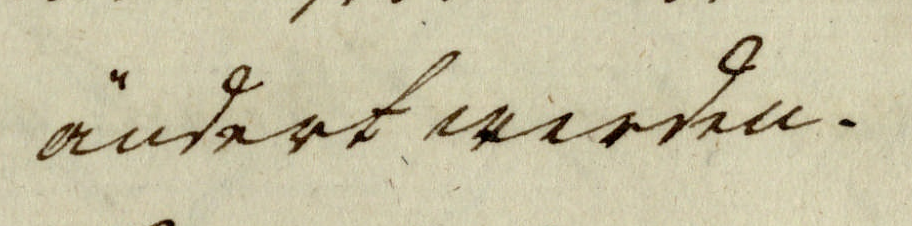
ändert werden.
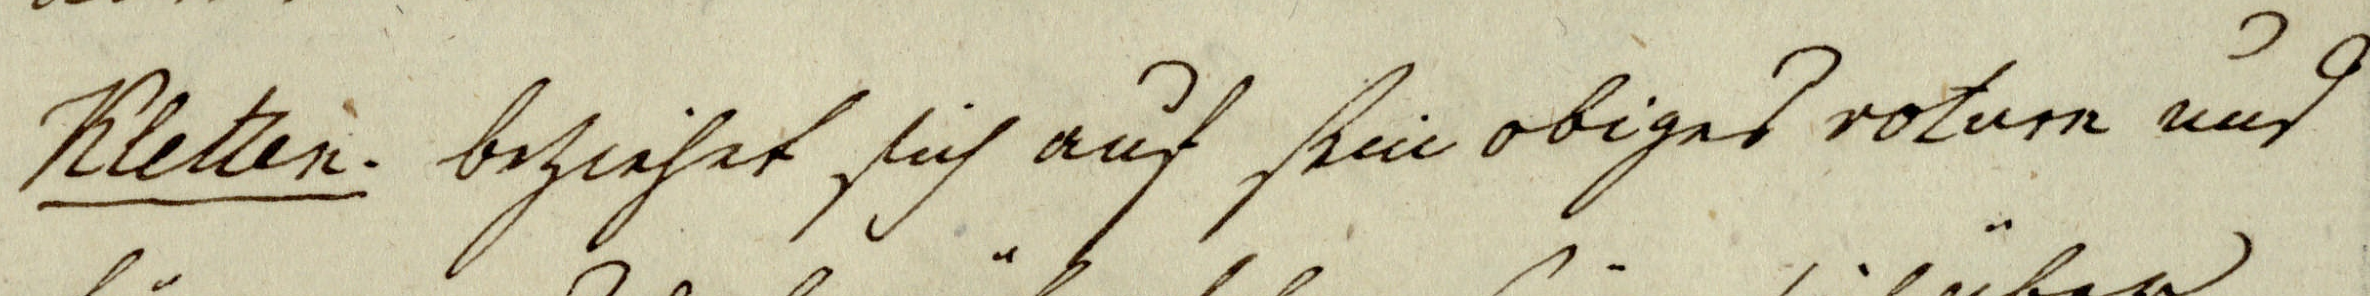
Kletten. beziehet sich auf sein obiges votum und
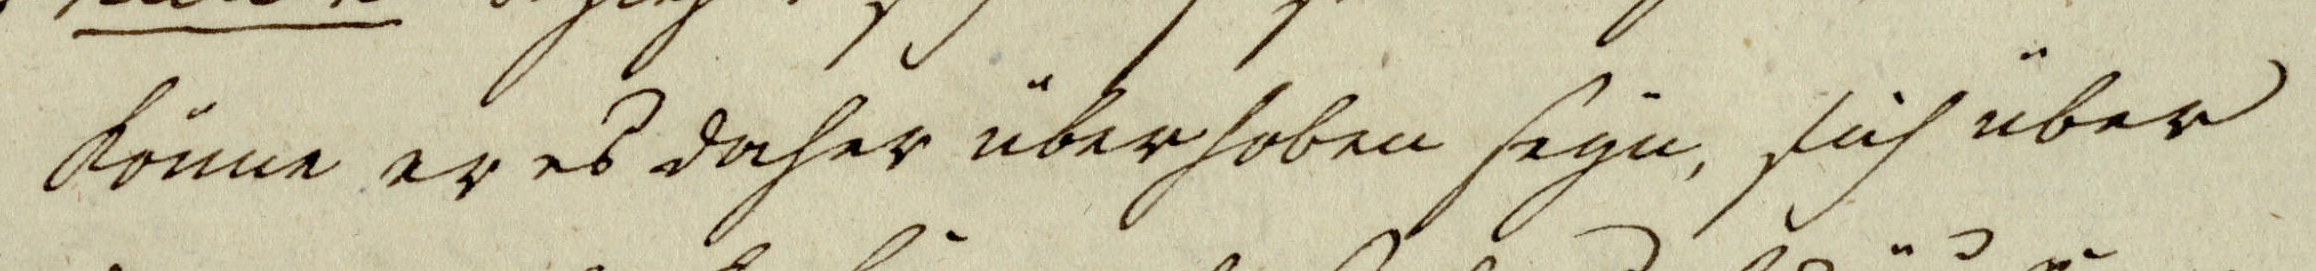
könne er es daher überhoben seÿn, sich über
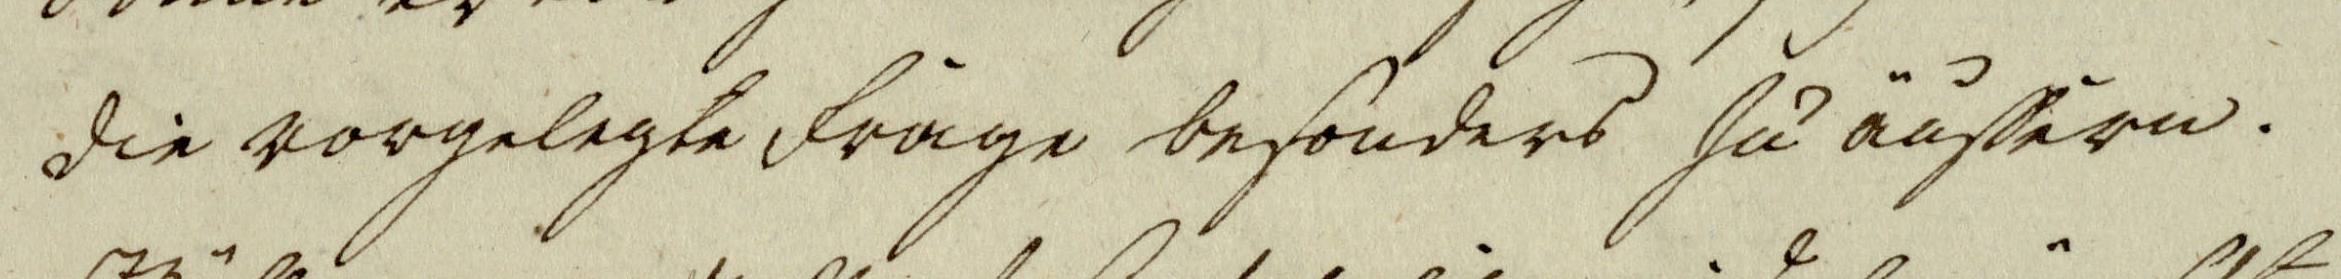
die vorgelegte Frage besonders zu äussern.
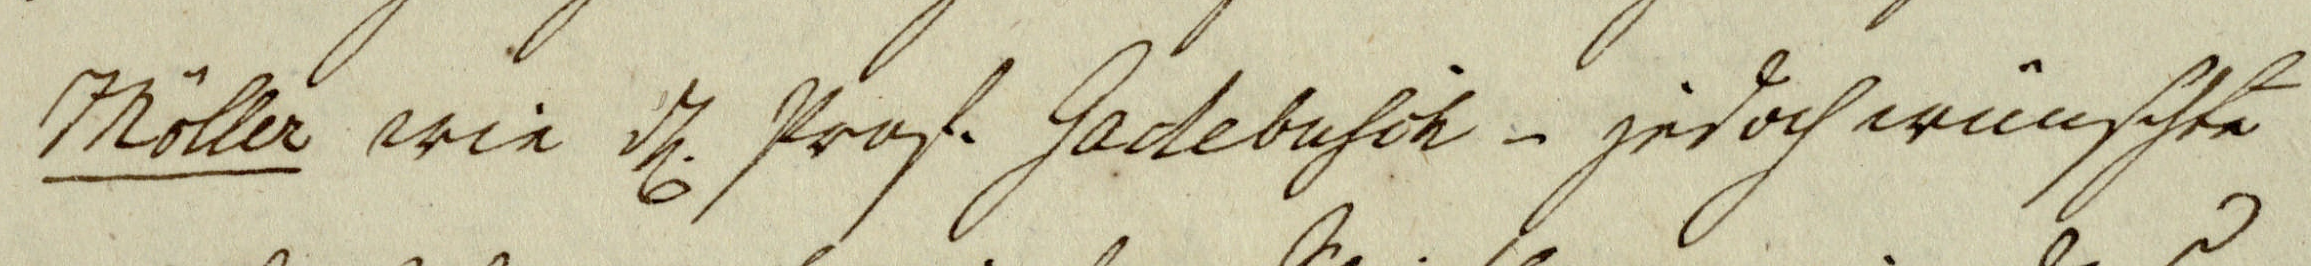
Möller wie dh. Prof. Gadebusch - jedoch wünschte
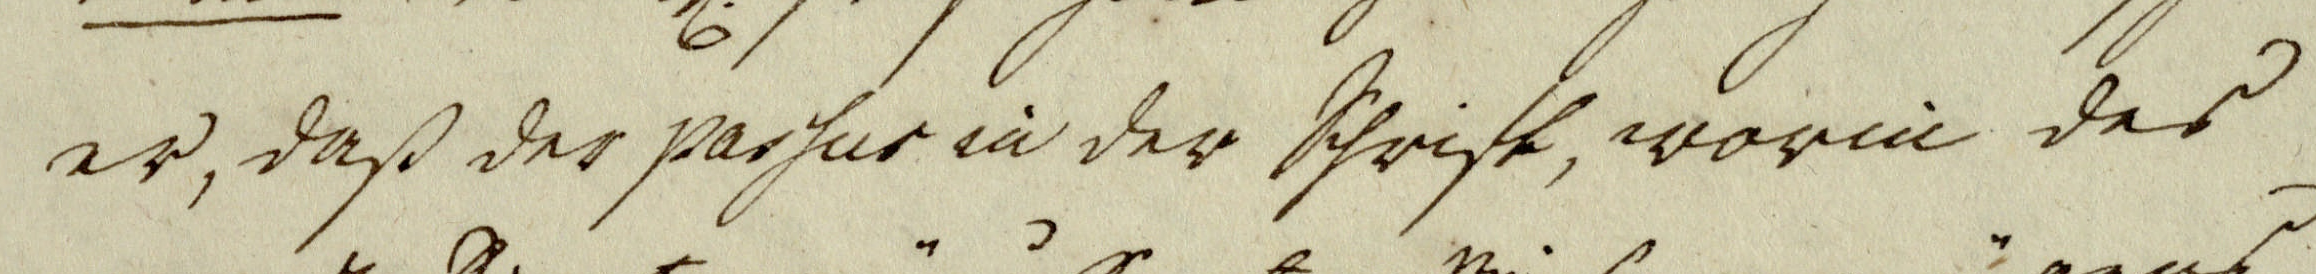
er, daß der passus in der Schrift, worin des
